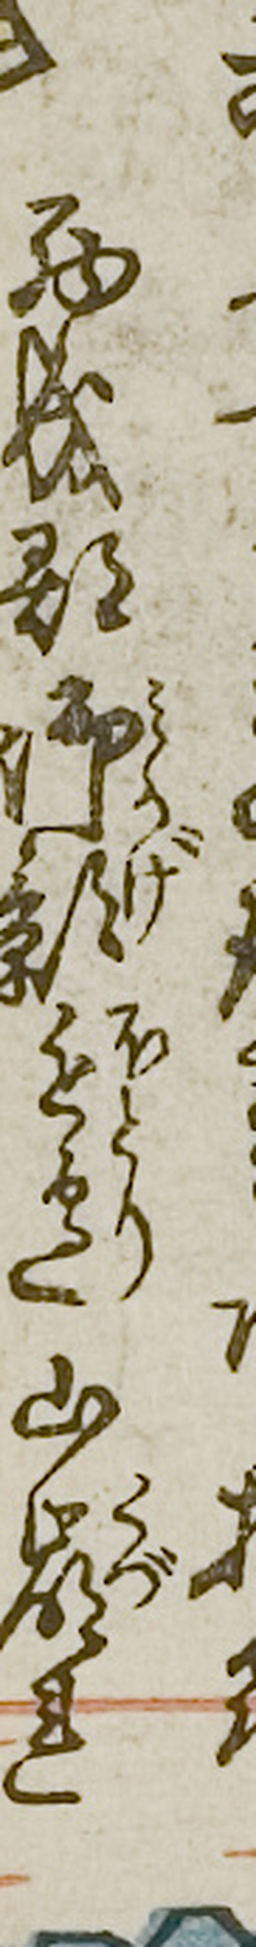西成郡御影近辺山崩れ
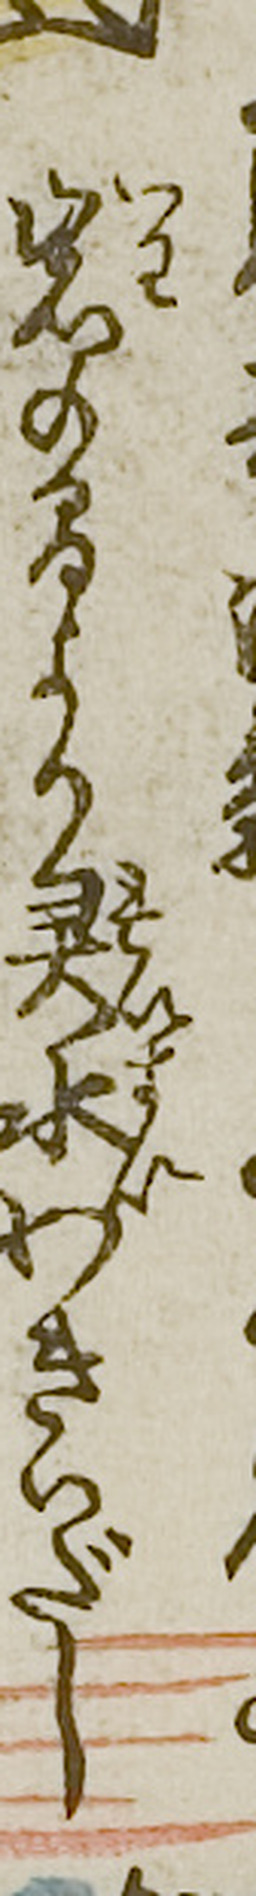岩の間より霊水わきいだし
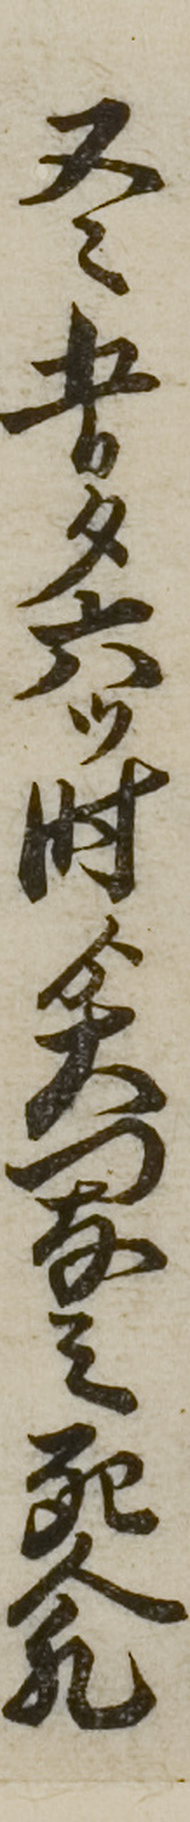又々五日夕六つ時より大つなみ死人凡
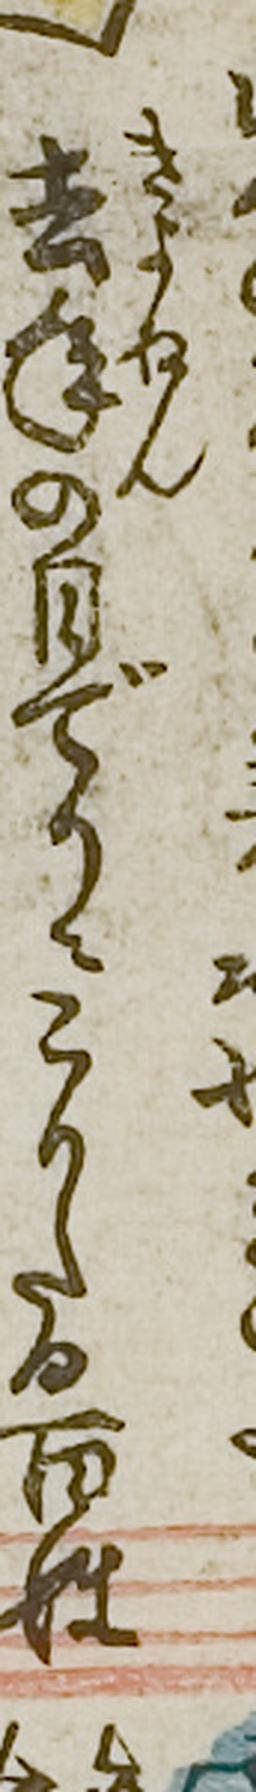去年の日でりにこりたる百姓
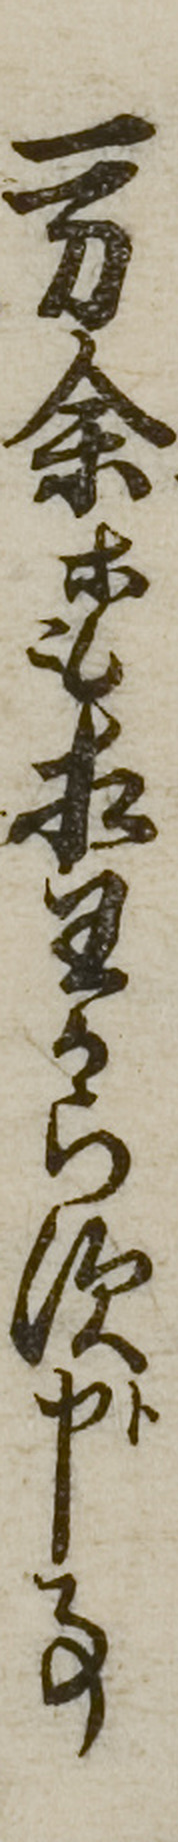一万余等も相わからずと申事
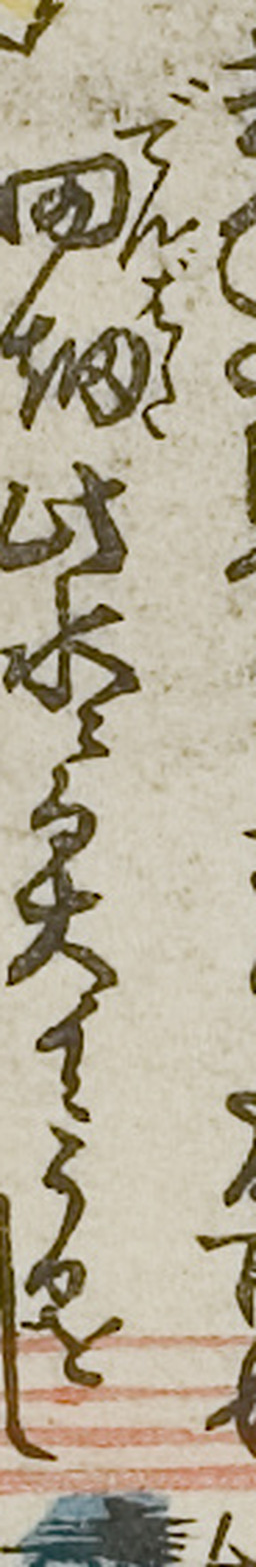田畑此水にて大いにうるをし
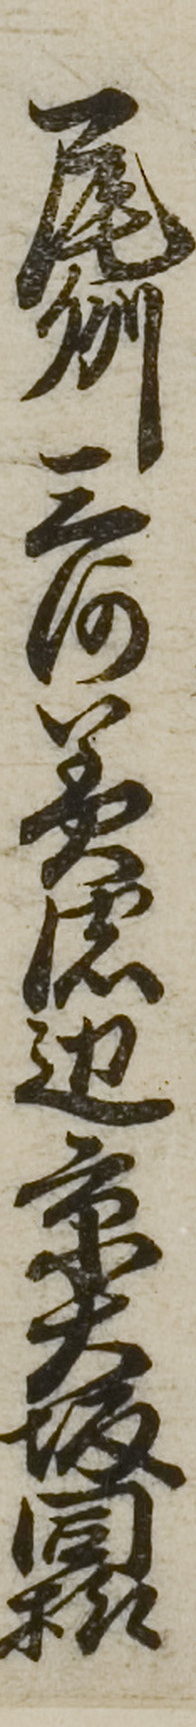尾州三河美濃辺京大坂同様
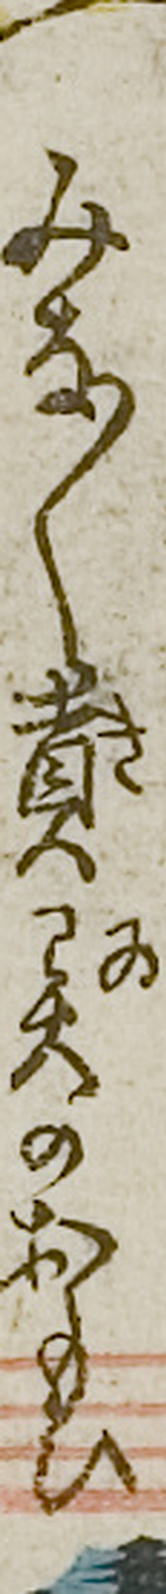みな〳〵貴異のおもひ
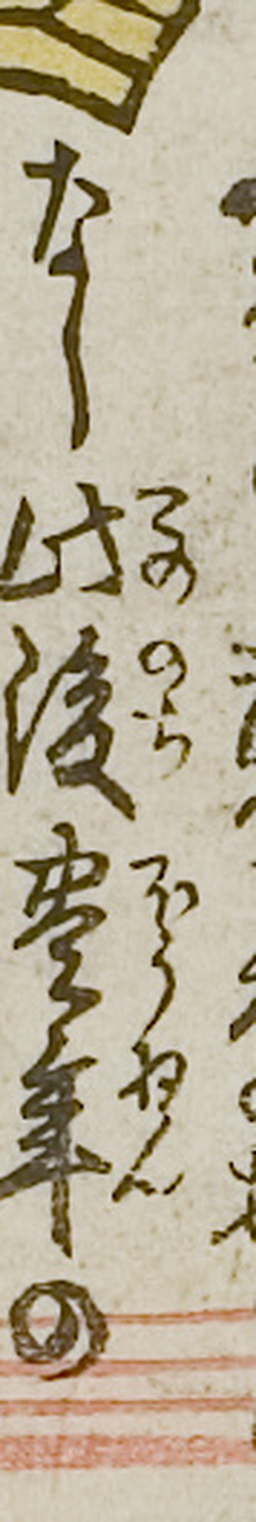なし此後豊年の
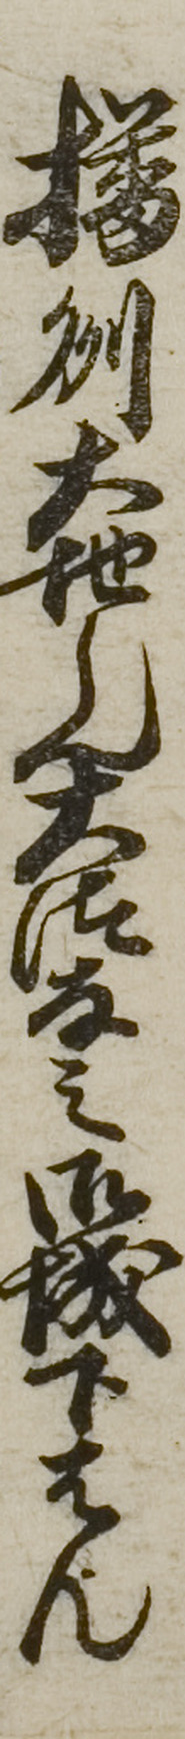播州大地しん大つなみ御城下はん
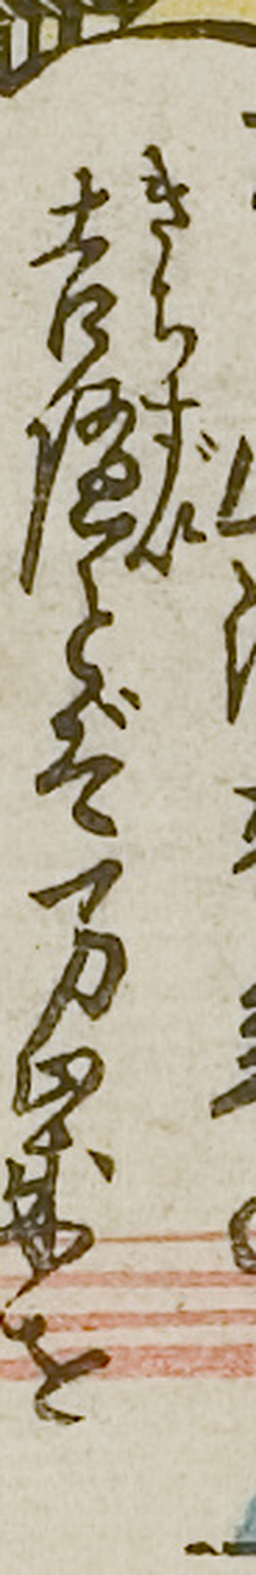吉随とぞ万歳を
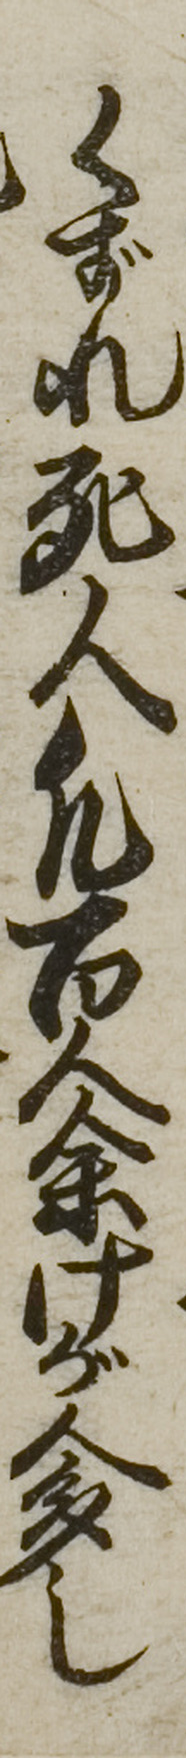くずれ死人凡百人余けが人多し
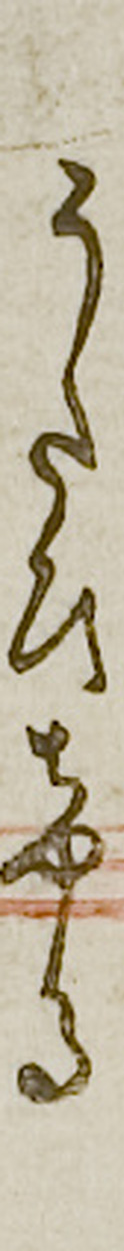うたひける
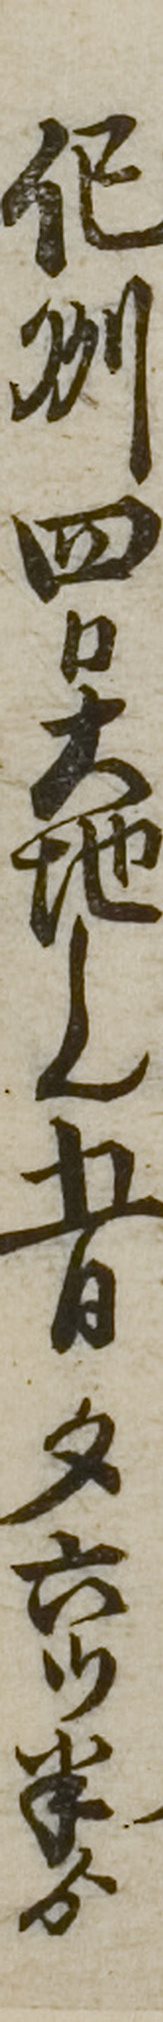紀州四日大地しん五日夕六つ半より
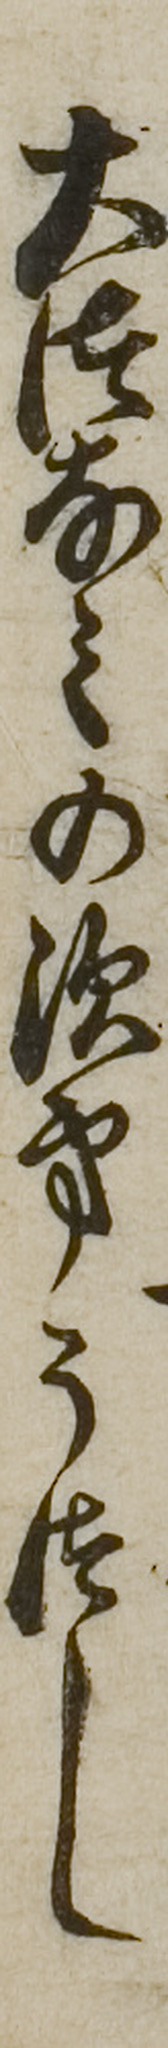大つなみの次第うつし
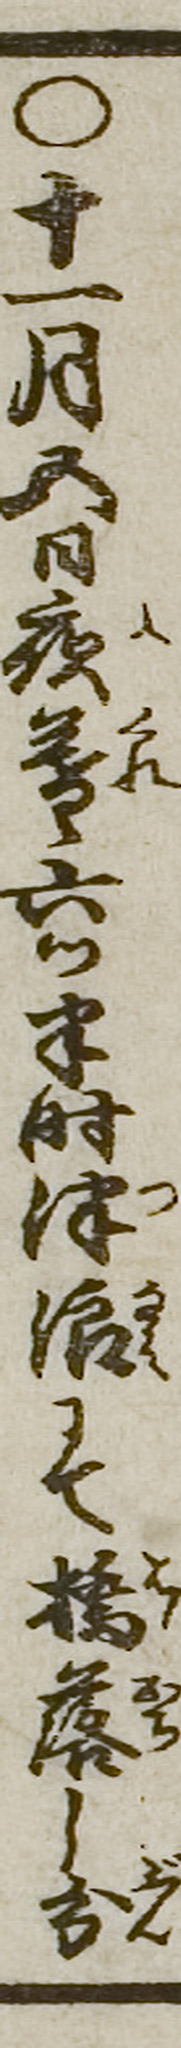○十一月五日夜暮六ツ半時津波にて橋落し分
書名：本しらべ諸国大地しん大つなミ
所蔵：東京大学総合図書館 General Library in the University of Tokyo, JAPAN
